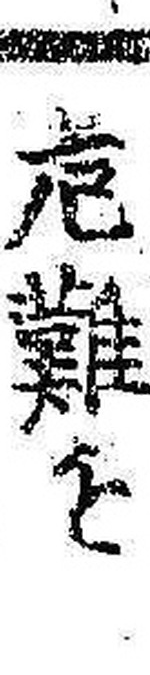危難を
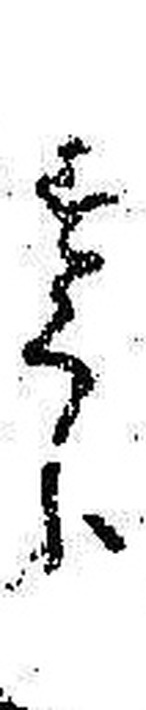すくふ
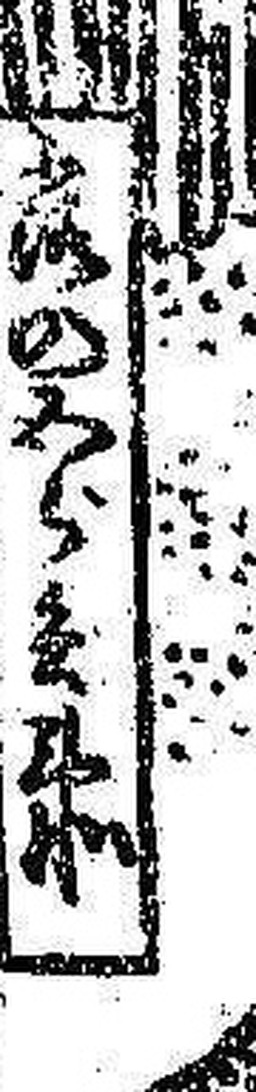露の五郎兵衛
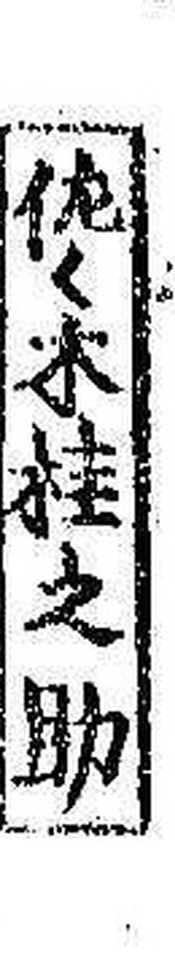佐々木桂之助
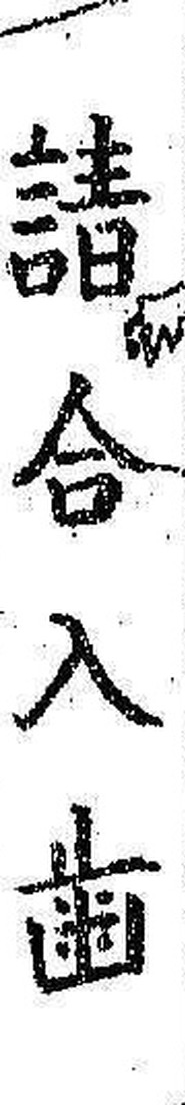請合入歯

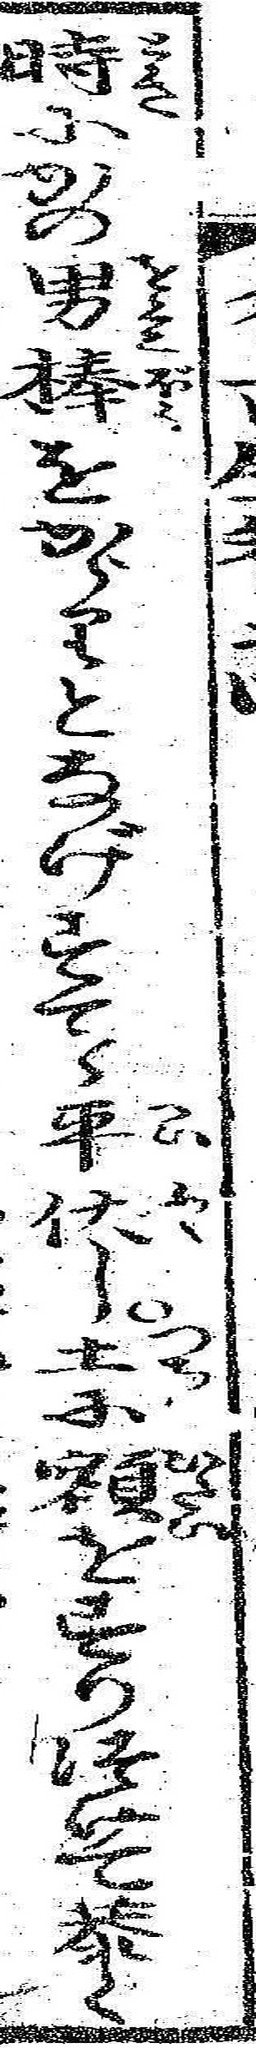時にかの男棒をからりとなげすてゝ平伏し。土に額をすりつけて恭く
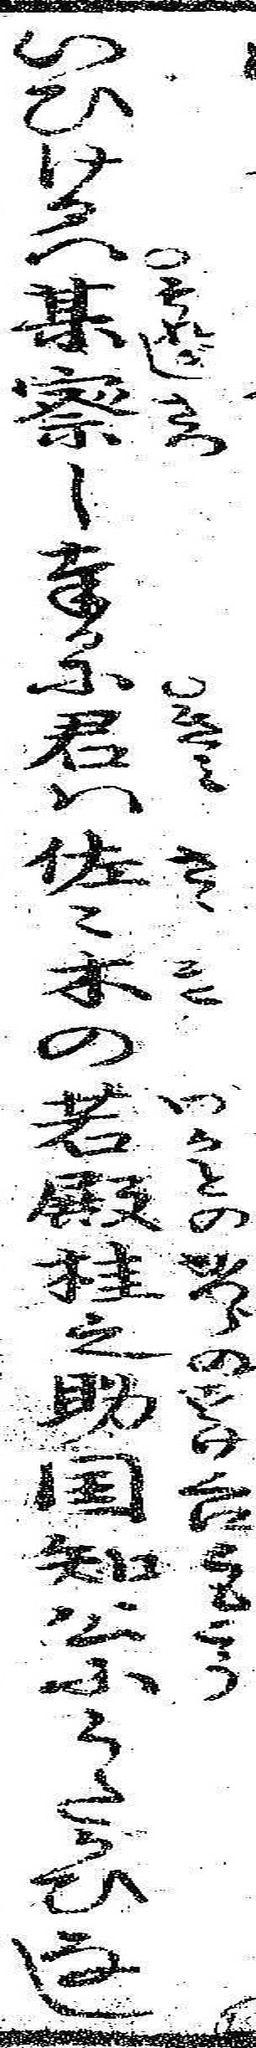いひけるは。某察し奉るに。君は佐々木の若殿桂之助国知公にうたがひなし
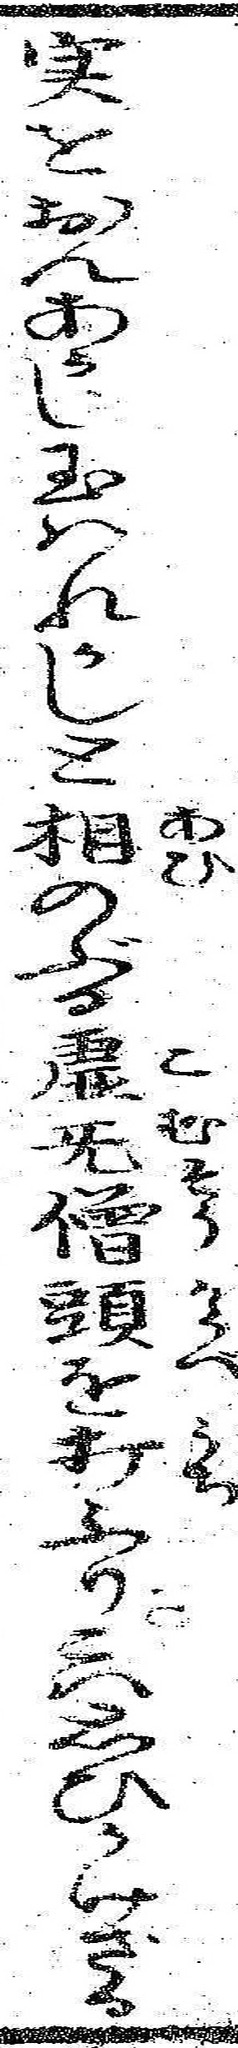実をおんあかし玉はれかしと相のぶる虚無僧頭を打ふり。こは思ひかけざる
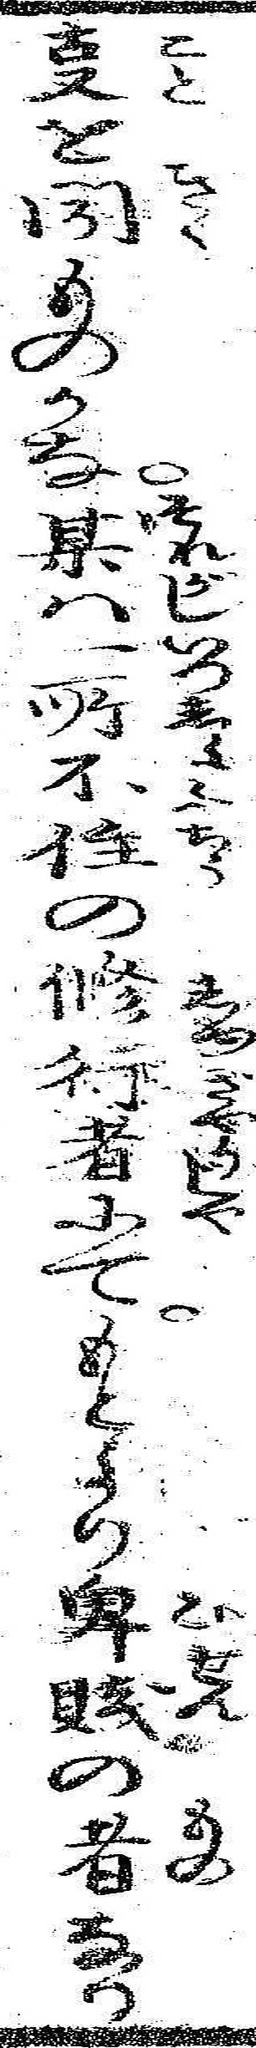事を聞ものかな。某は一所不住の修行者にて。もとより卑賤の者なり
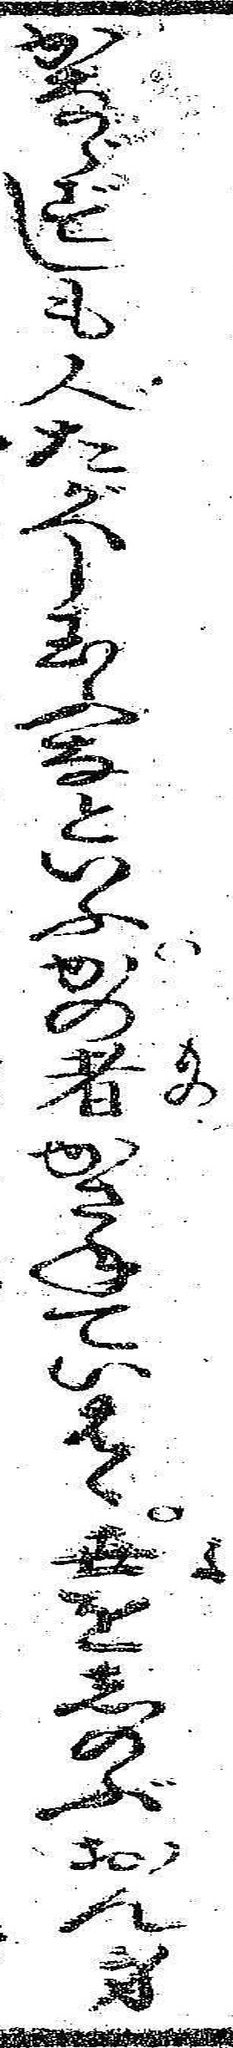かならずしも人たがへし玉ふなといふ。かの者かさねていはく。世をしのぶおん身
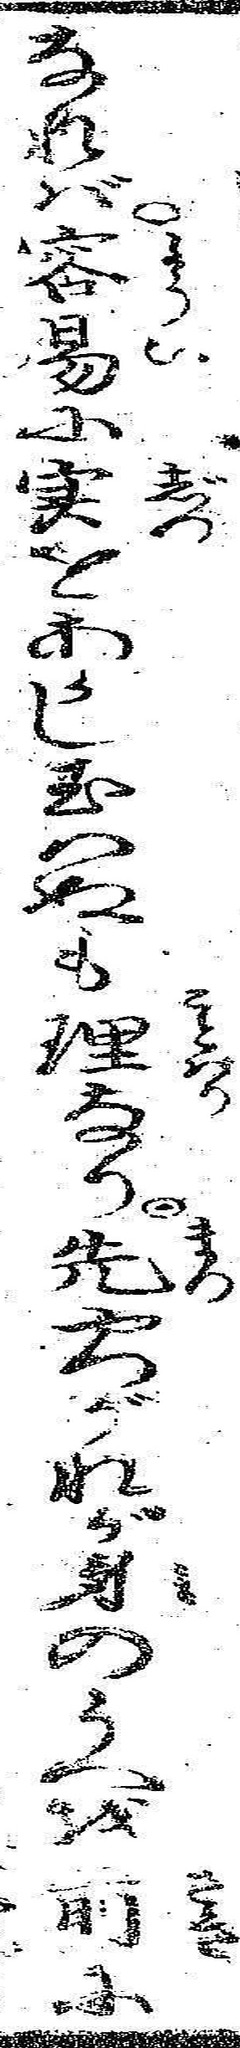なれば。容易に実をあかし玉はぬも理なり。先やつがれが身のうへを前に
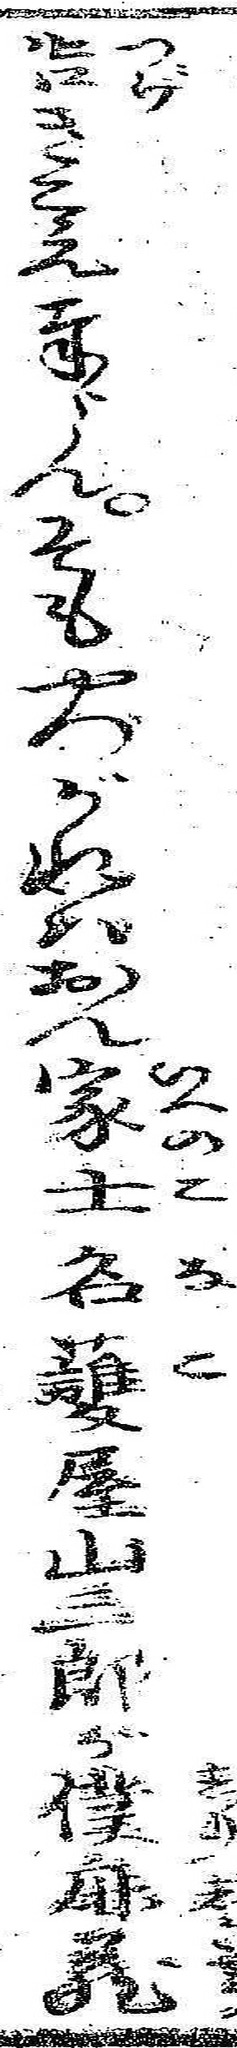告きこえ奉らん。そもやつがれはおん家士名護屋山三郎が僕鹿蔵
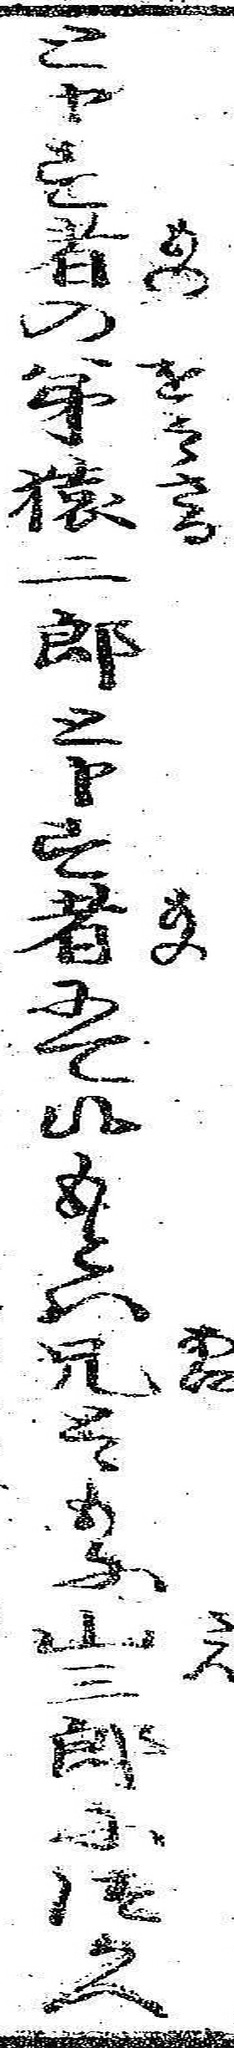と申す者の弟猿二郎と申す者にて候もとは兄とゝもに山三郎につかへ
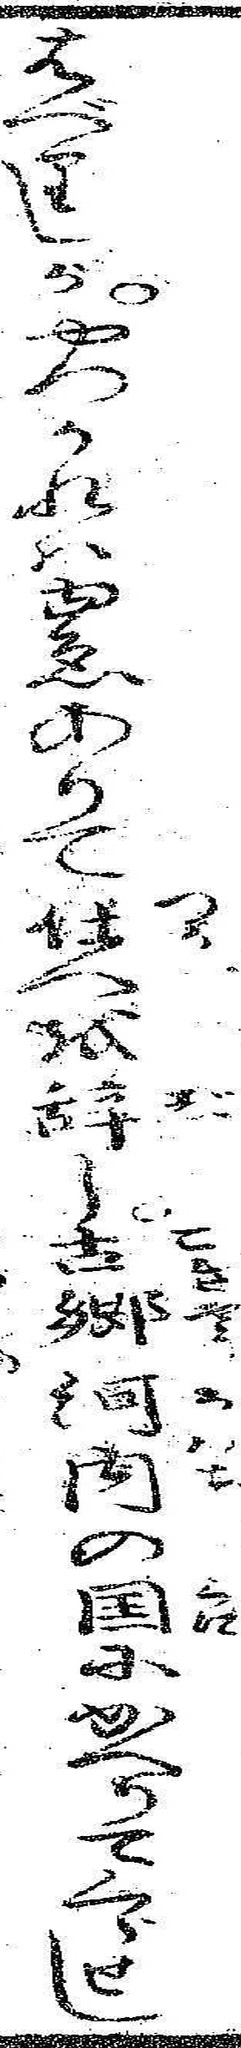はべりしが。やつかれはゆゑありて仕へを辞し。古郷河内の国にかへりてくらせし
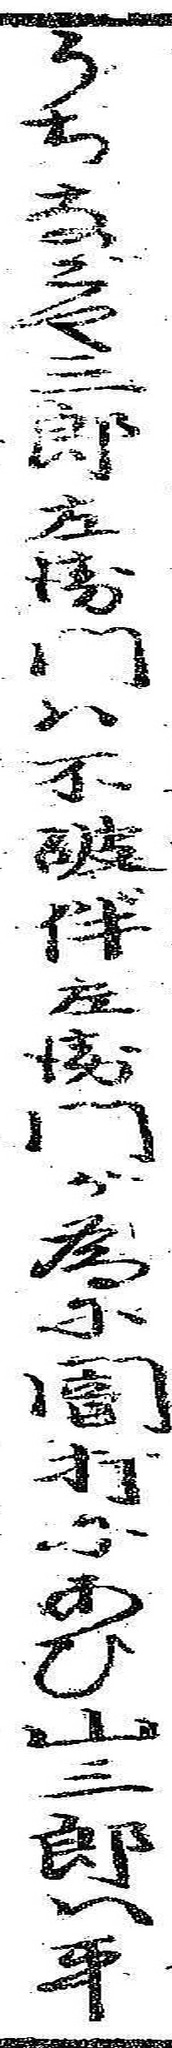うちなごや三郎左衛門は不破伴左衛門が為に闇打にあひ山三郎は平
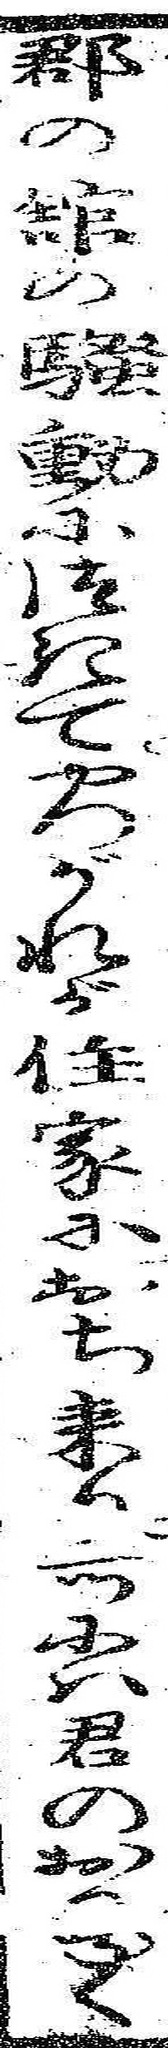郡の館の騒動につきて。やつがれが住家におち来り。一ツには君のおんゆく
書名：昔話稲妻表紙
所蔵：国文学研究資料館
